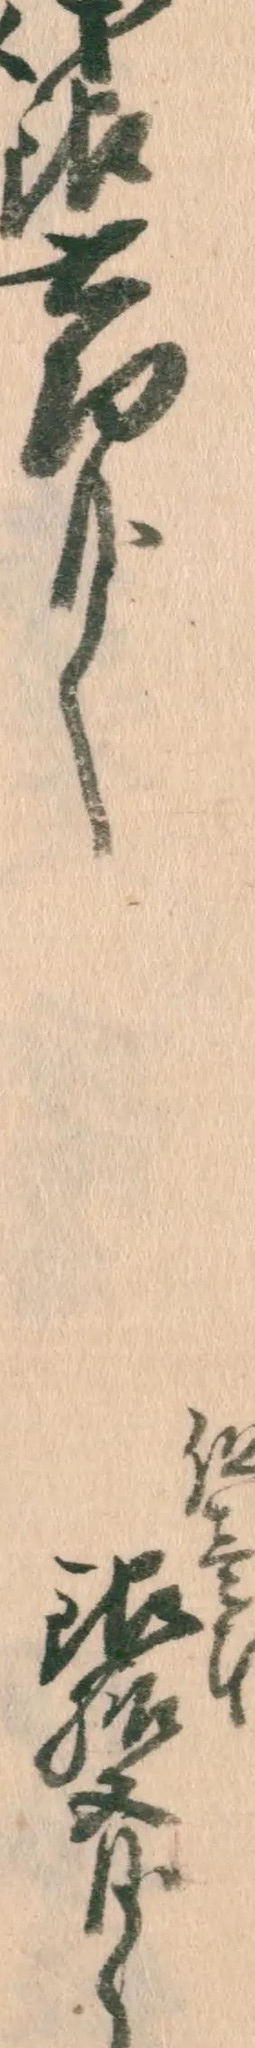代銀六百匁銀拾五匁
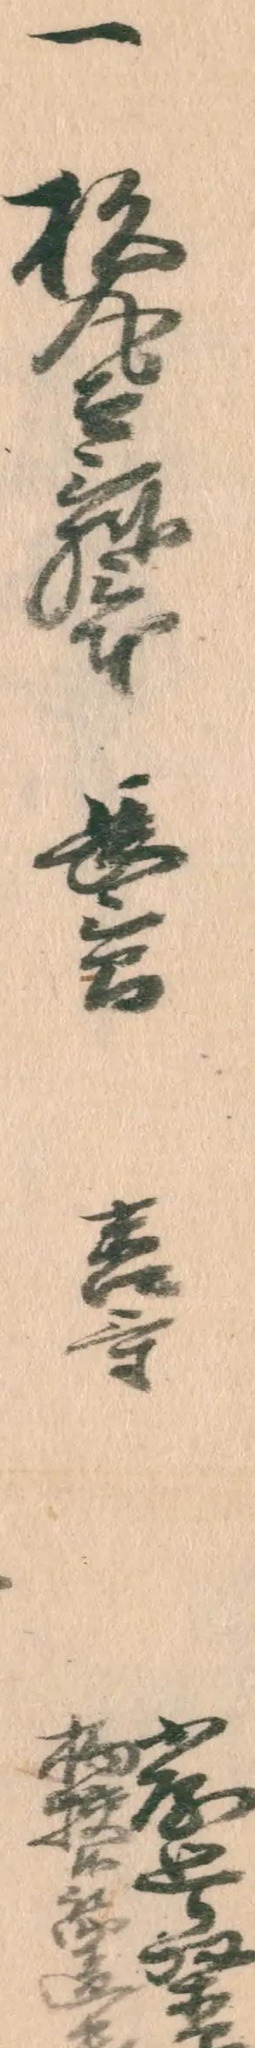一杉丸太三拾三本長三間表三寸小屋廻り梁間
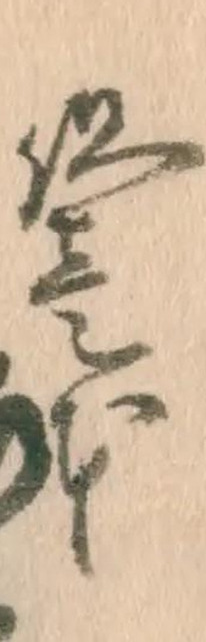但壱本
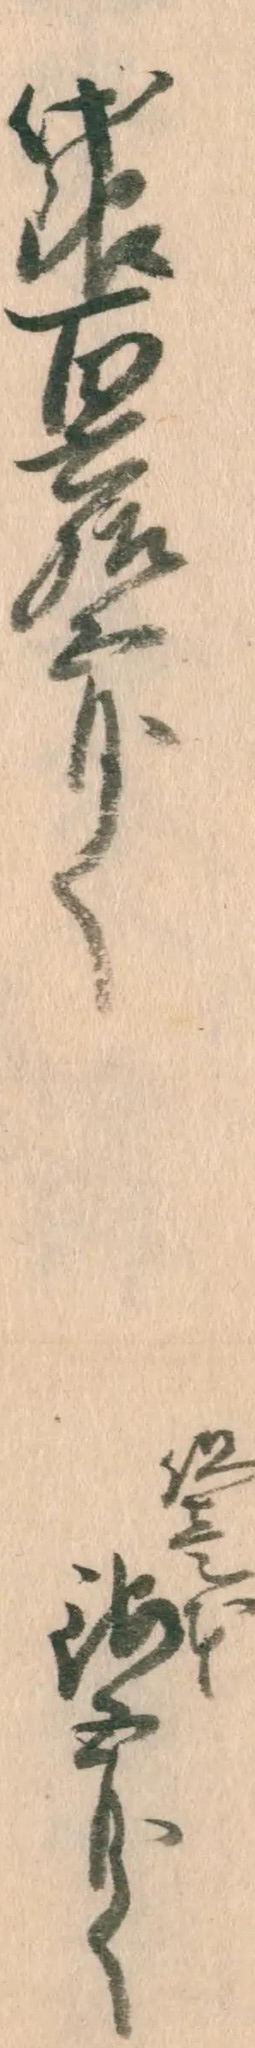代銀百六拾五匁銀五匁

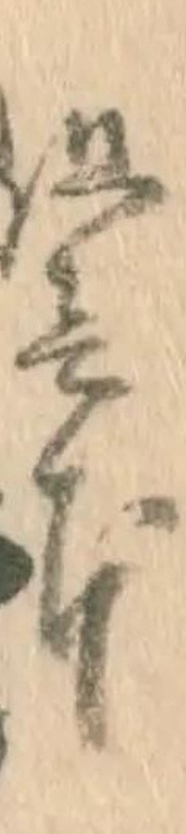但壱本
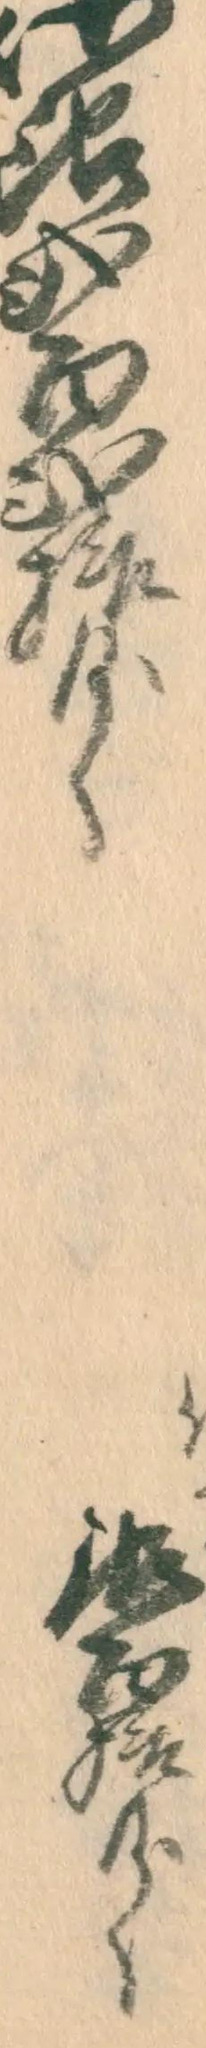代銀弐百弐拾匁銀壱百拾匁
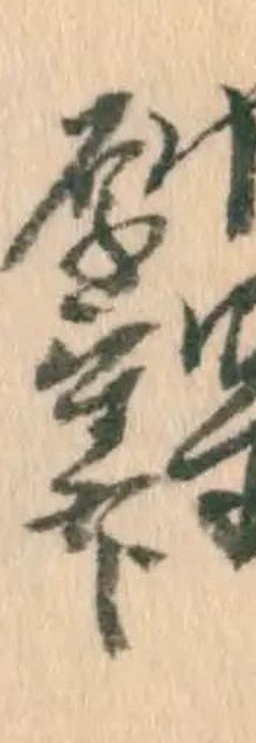厚四寸五分
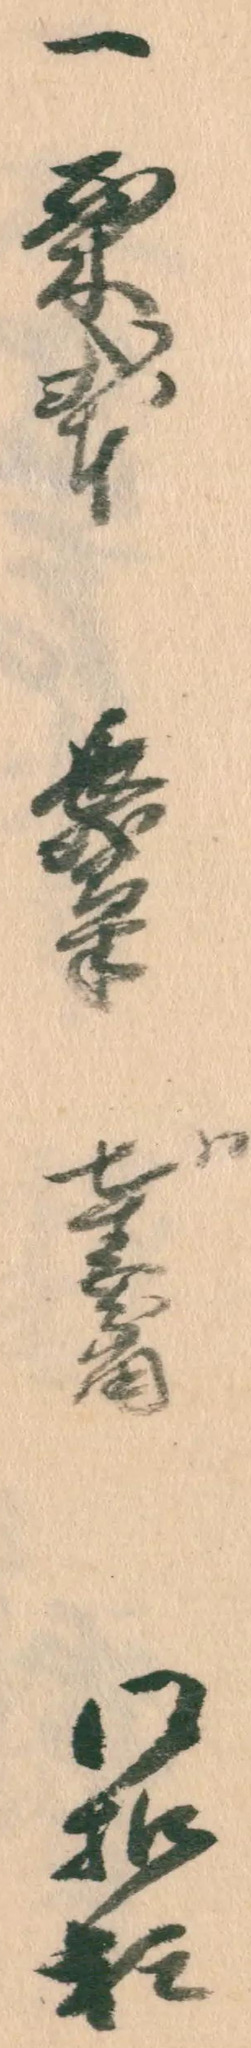一栗弐本長弐間半同七寸五分角同扣柱
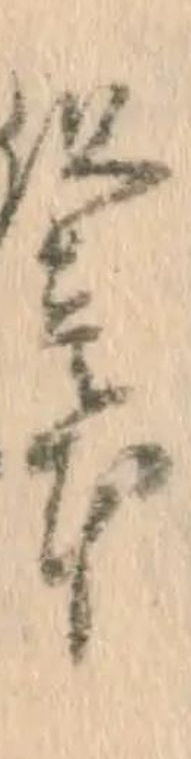但壱本
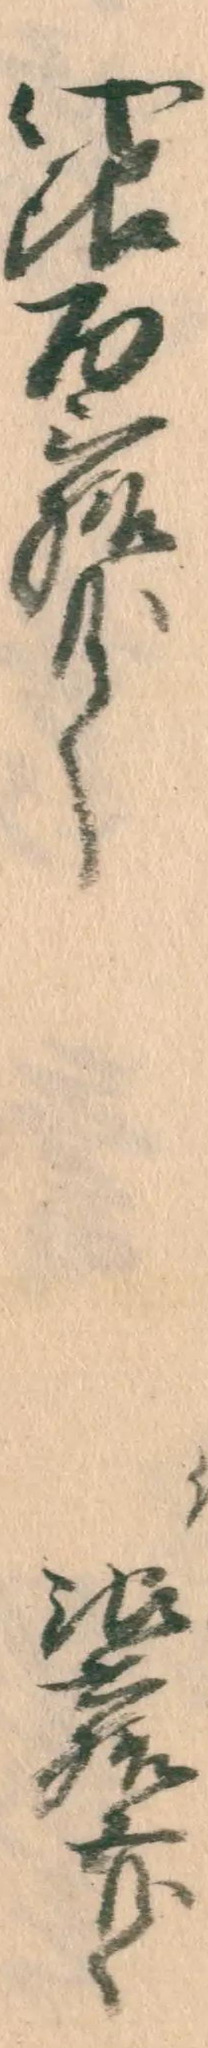代銀百参拾匁銀六拾五匁
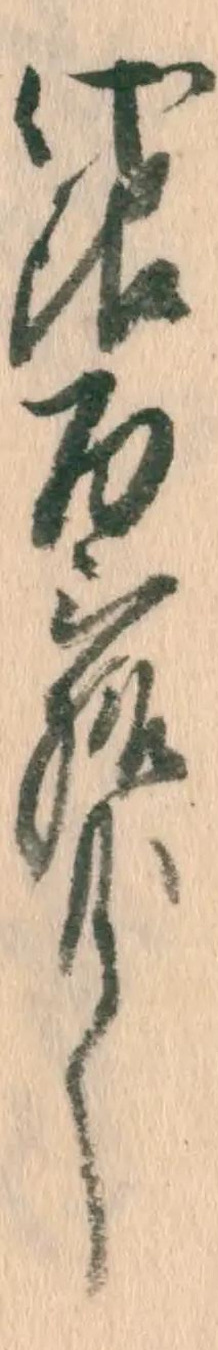代銀拾三匁
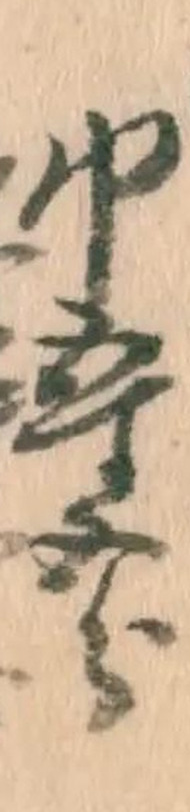厚四寸五分
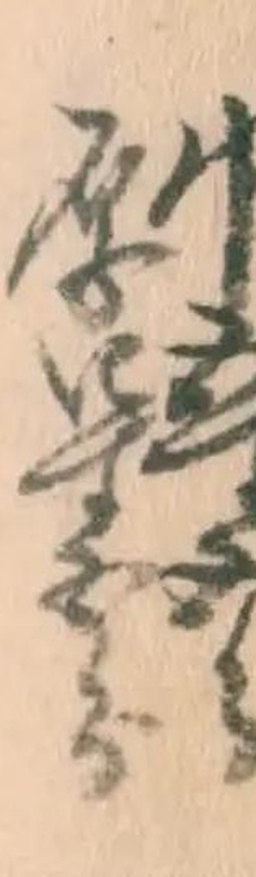厚四寸五分
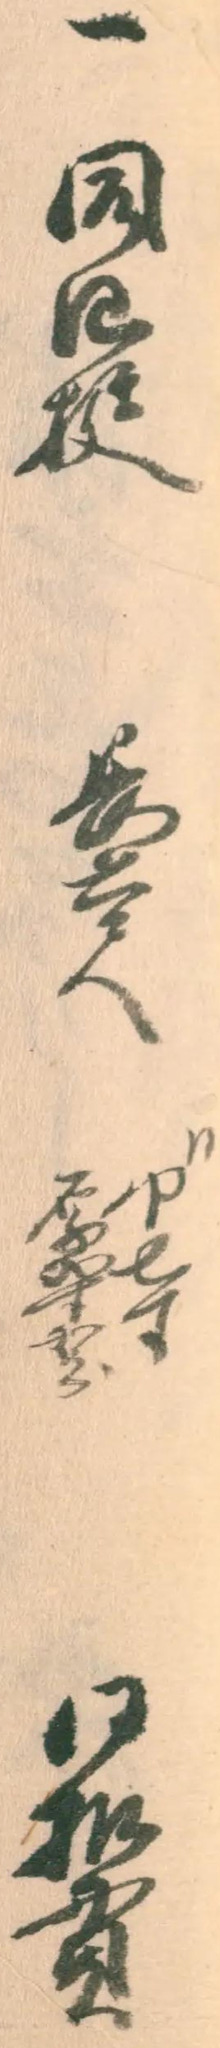一同四挺長六尺同巾七寸同扣貫
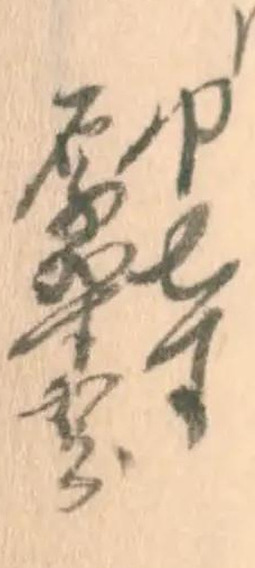厚四寸五分
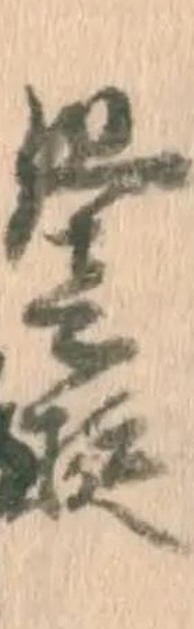但壱本
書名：三十三間堂. [1]
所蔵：国立国会図書館 National Diet Library, JAPAN
